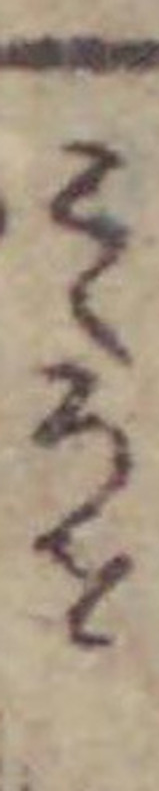こゝろを
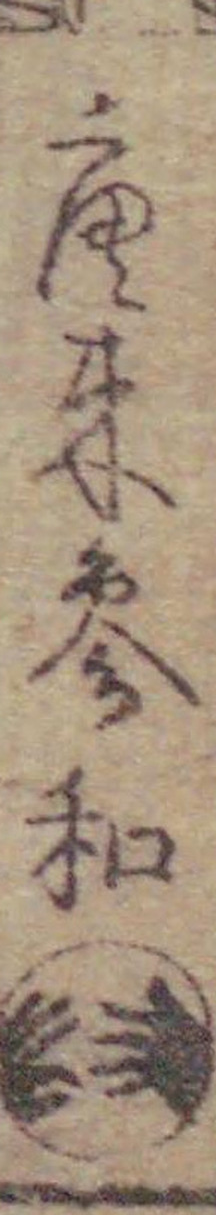唐来三和
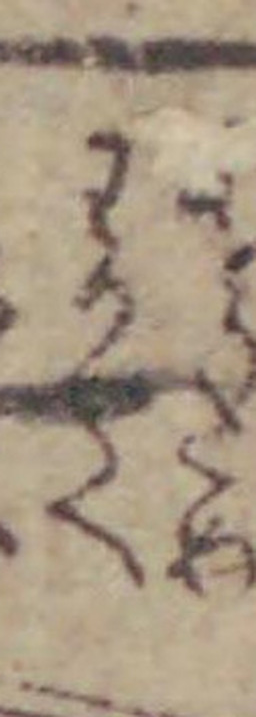わかやへ
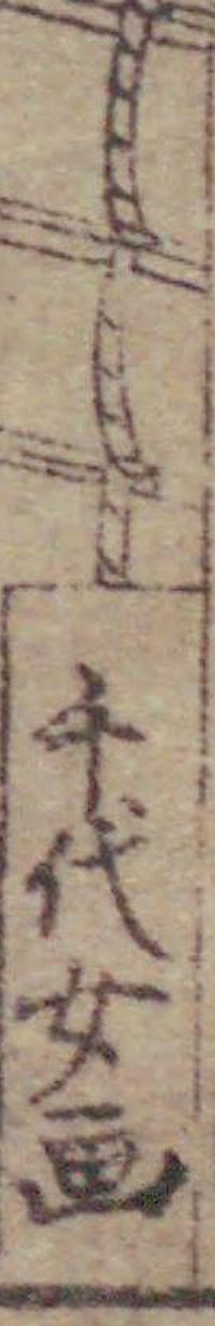千代女画
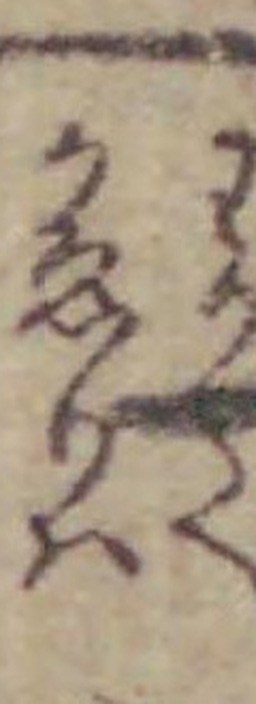かゑりは
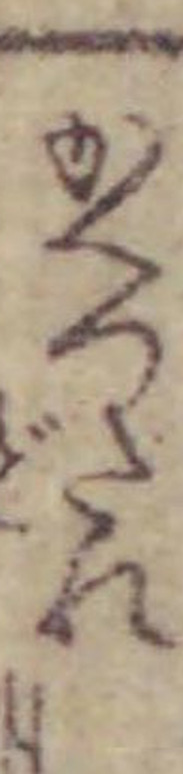かへつたれ
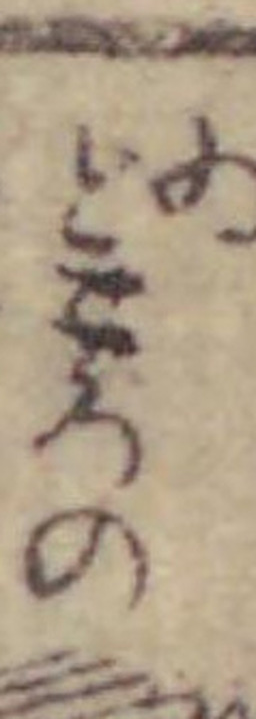どころの
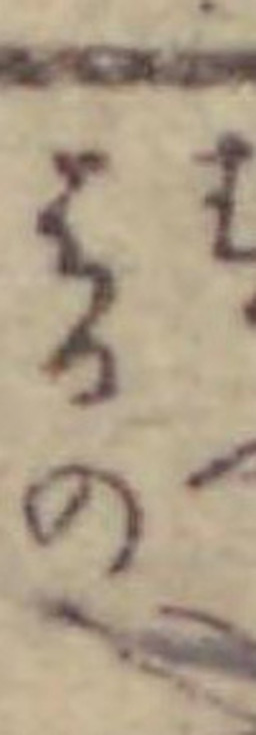はるの
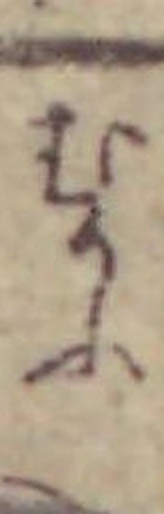むかふ
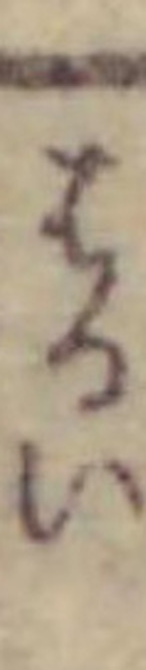はるい
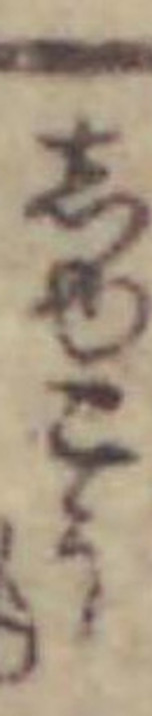しゆこう
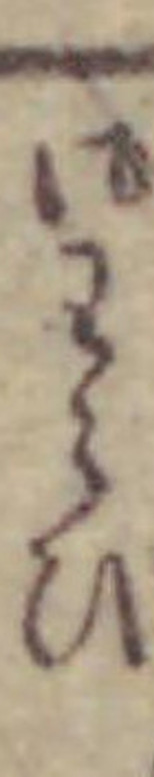御わらひ
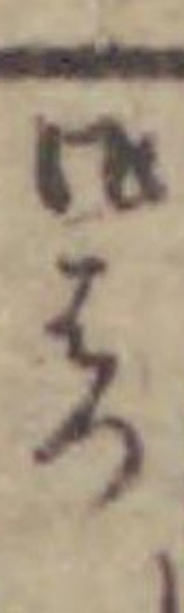御はつ
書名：莫切自根金生木 : 3巻
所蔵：国立国会図書館 National Diet Library, JAPAN
